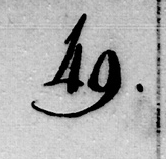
400.
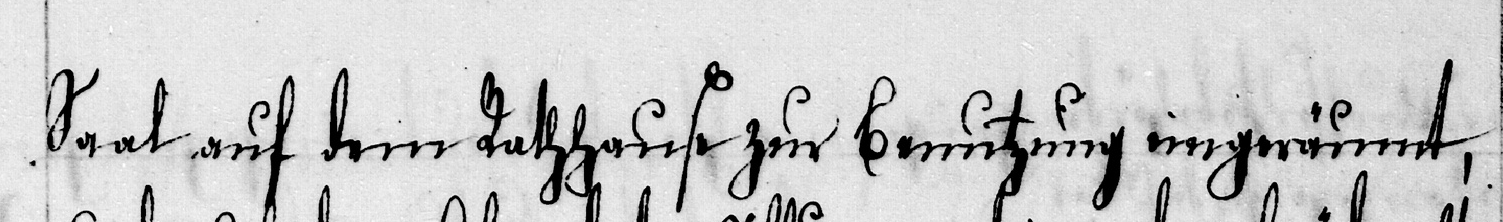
Saal auf dem Rathhause zur Benutzung eingeräumt,
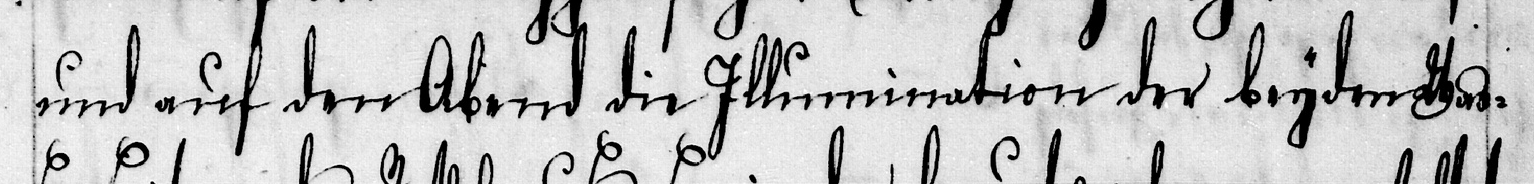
und auf den Abend die Illumination der beyden Wa¬
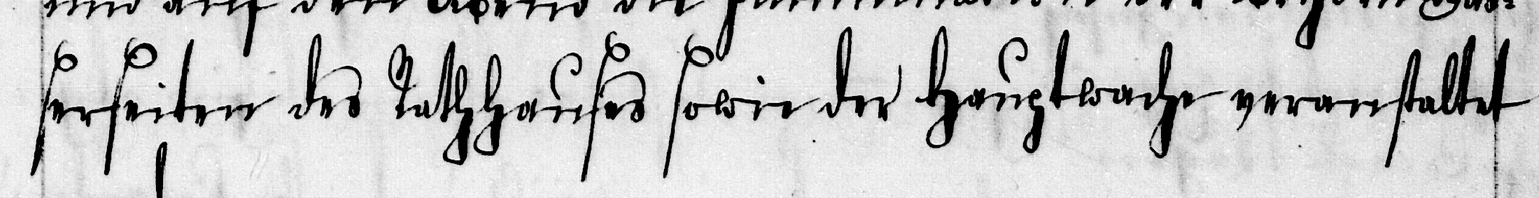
ßerseiten des Rathhauses sowie der Hauptwache veranstaltet
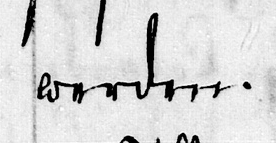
werden.
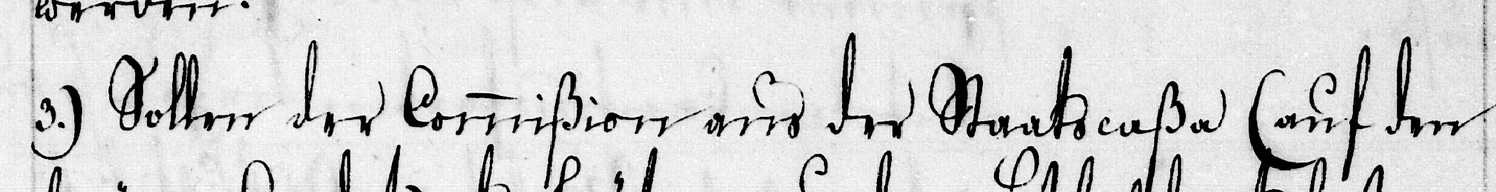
3.) Sollen der Commißion aus der Staatscaßa (auf den
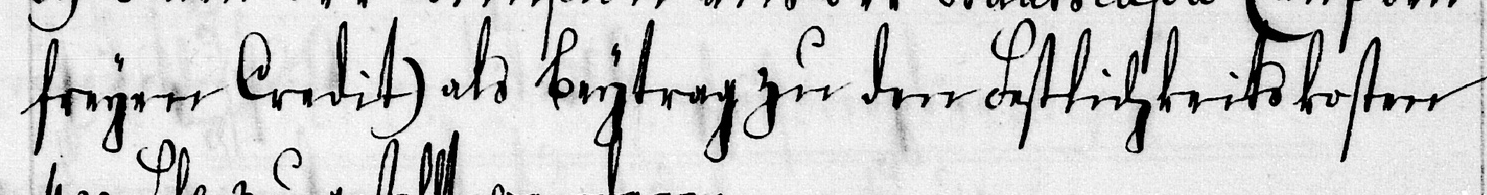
freyen Credit) als Beytrag zu den Festlichkeitskosten
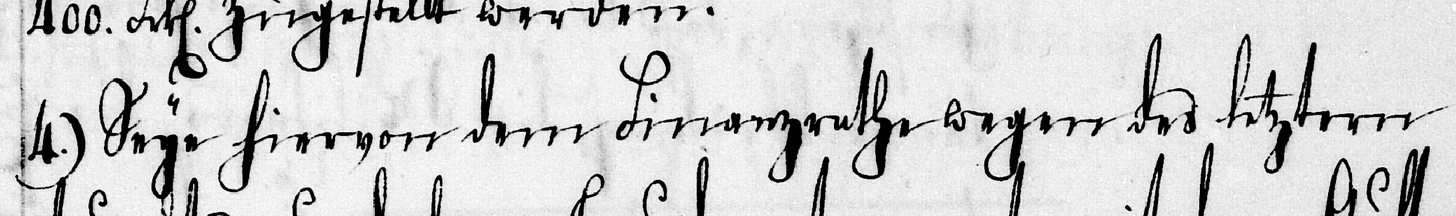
4.) Seye hiervon dem Finanzrathe wegen des letztern
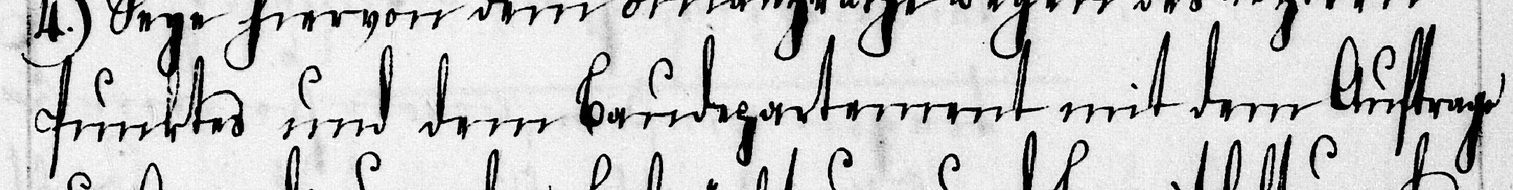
Punktes und dem Baudepartement mit dem Auftrag
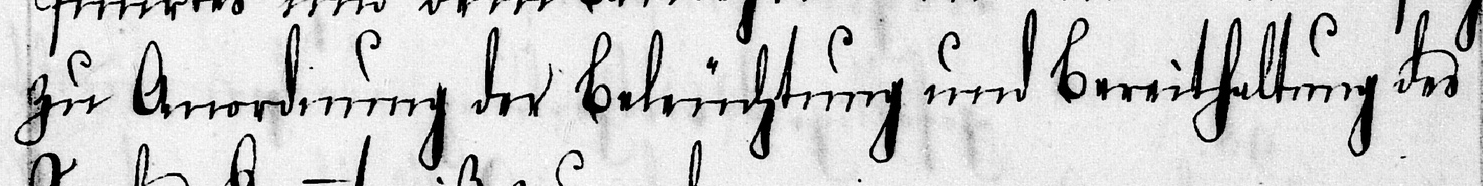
zu Anordnung der Beleuchtung und Bereithaltung des
